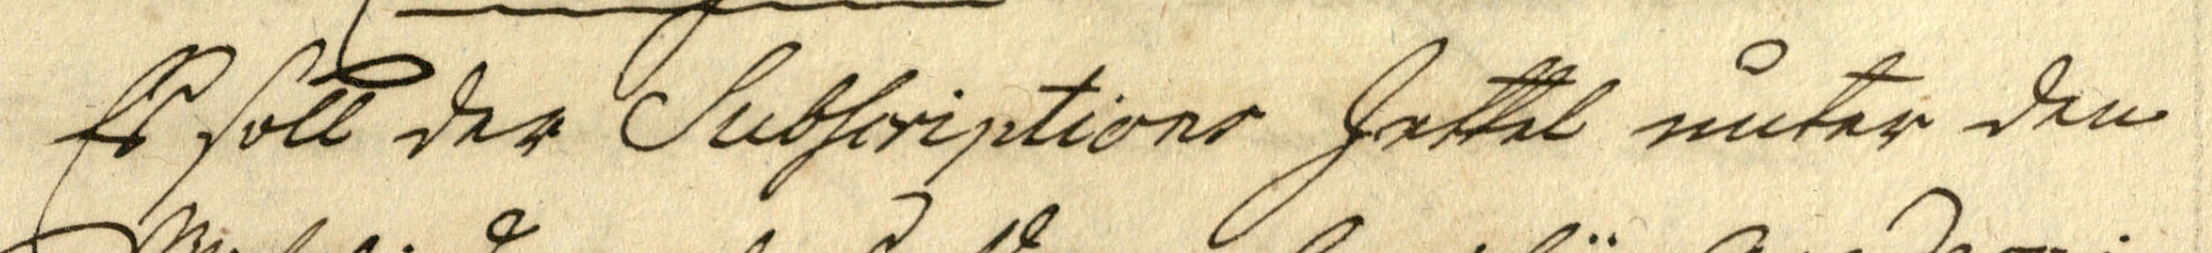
Es soll der Subscriptions Zettel unter den
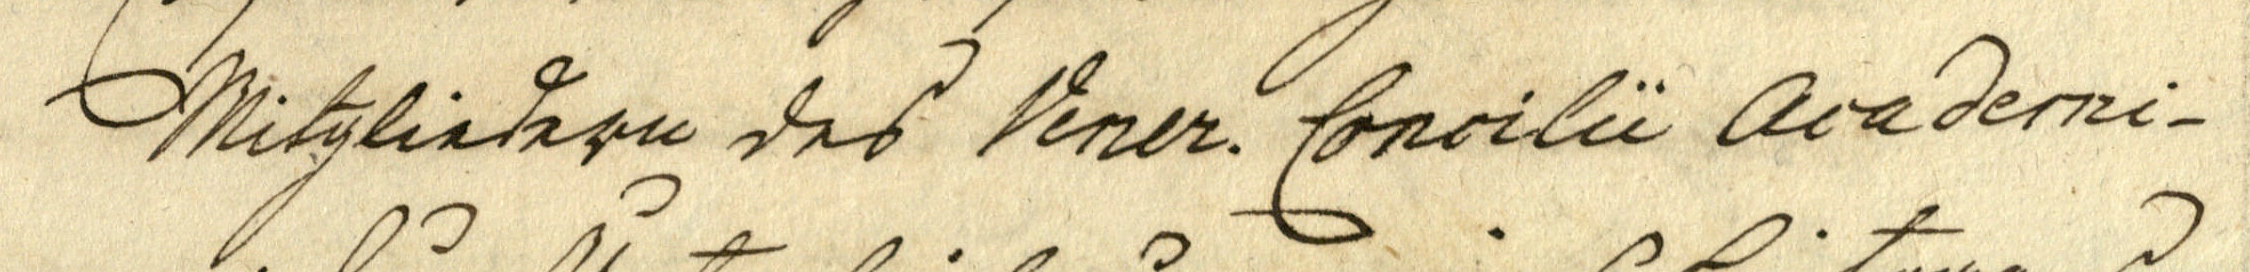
Mitgliedern des Vener. Concilii Academi-
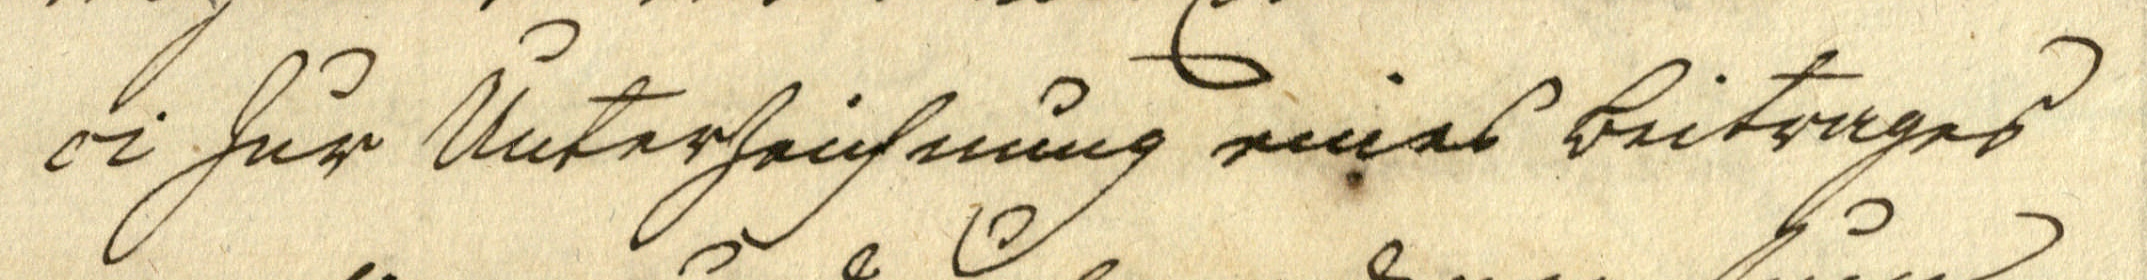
ci zur Unterzeichnung eines Beitrages
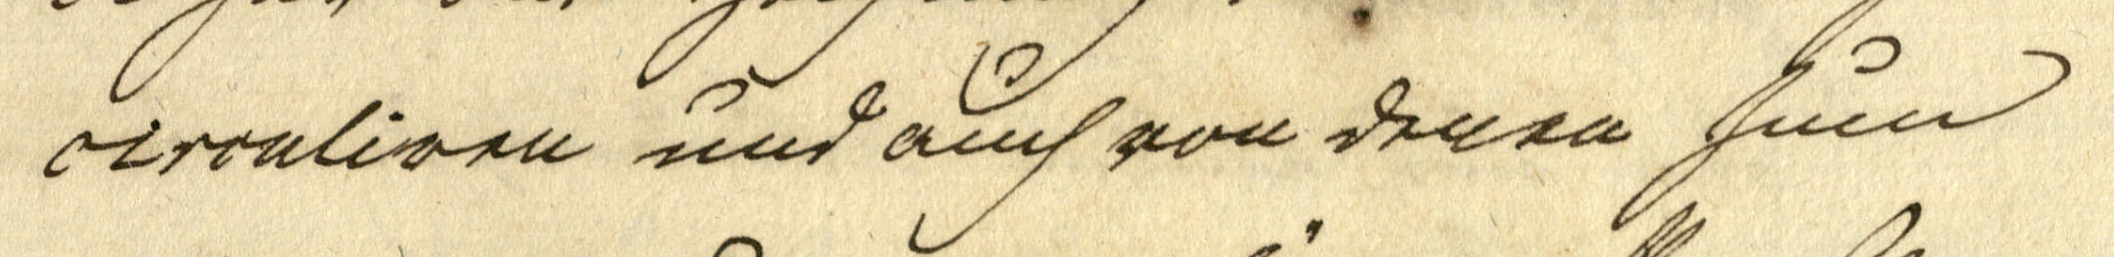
circuliren und auch von denen zum
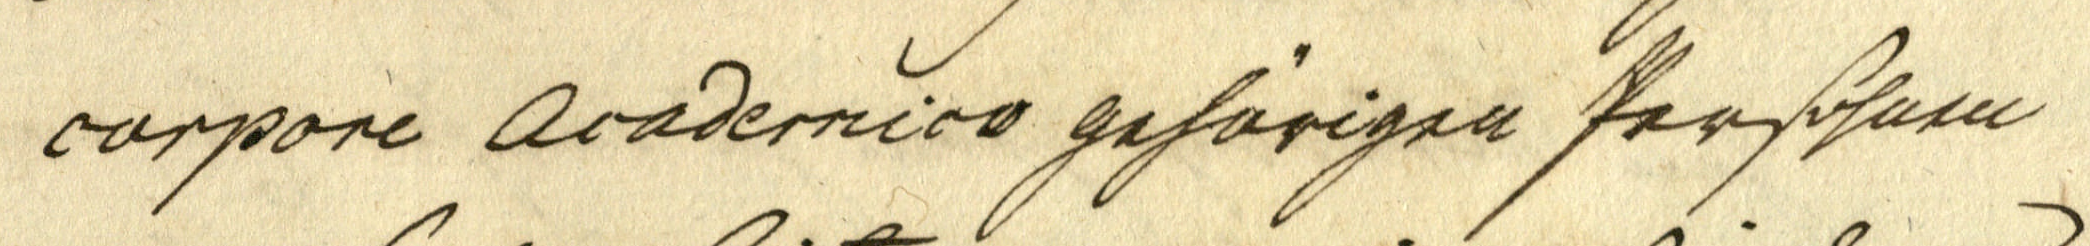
corpore Academico gehörigen Persohnen
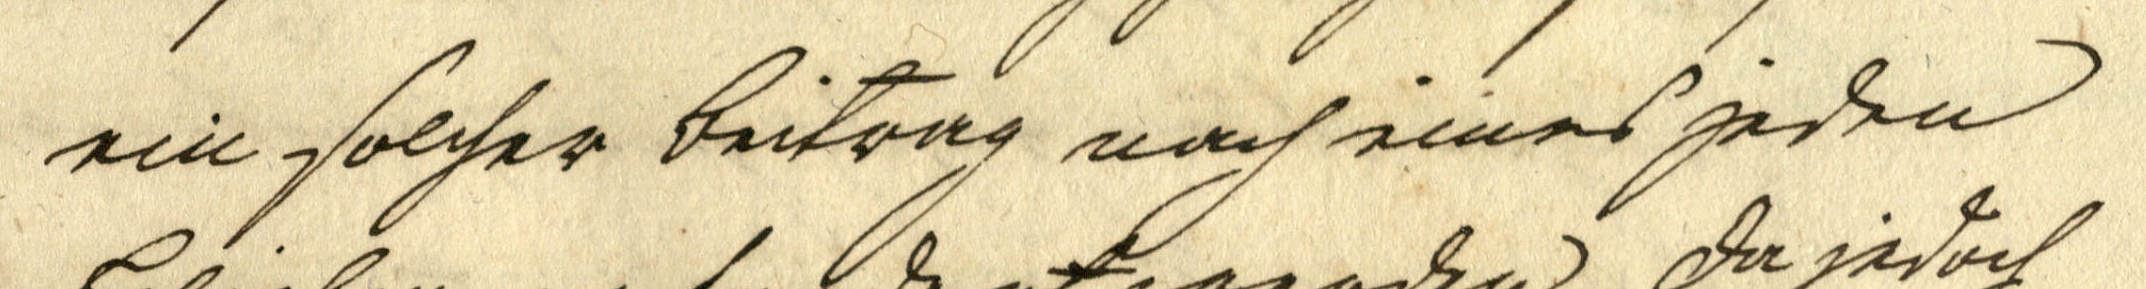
ein solcher Beitrag nach eines jeden
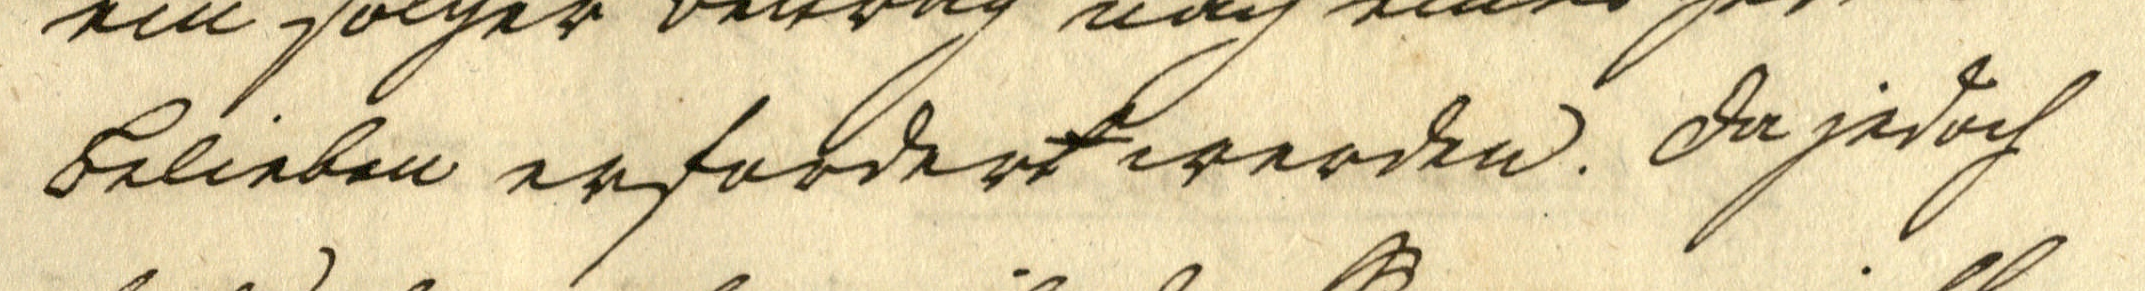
Belieben erfordert werden. Da jedoch
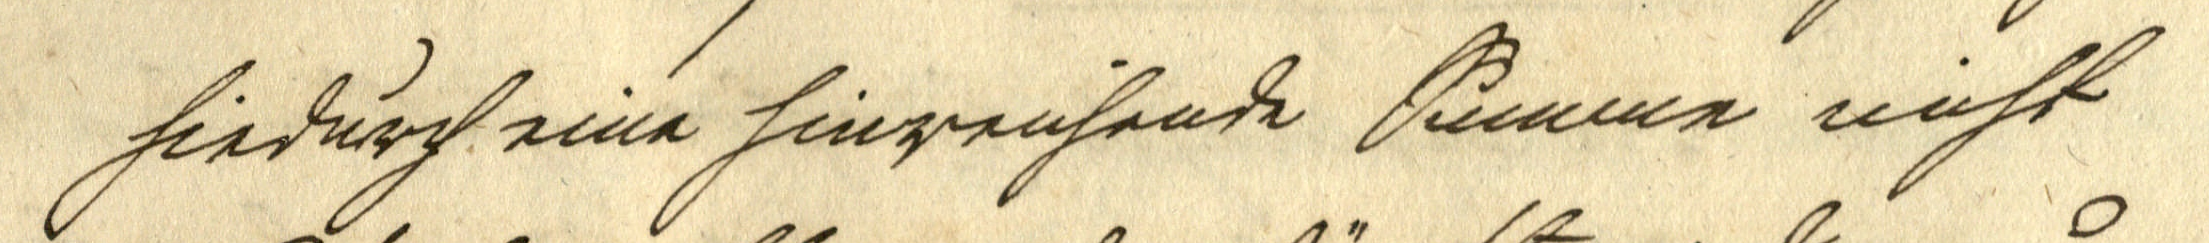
hiedurch eine hinreichende Summe nicht
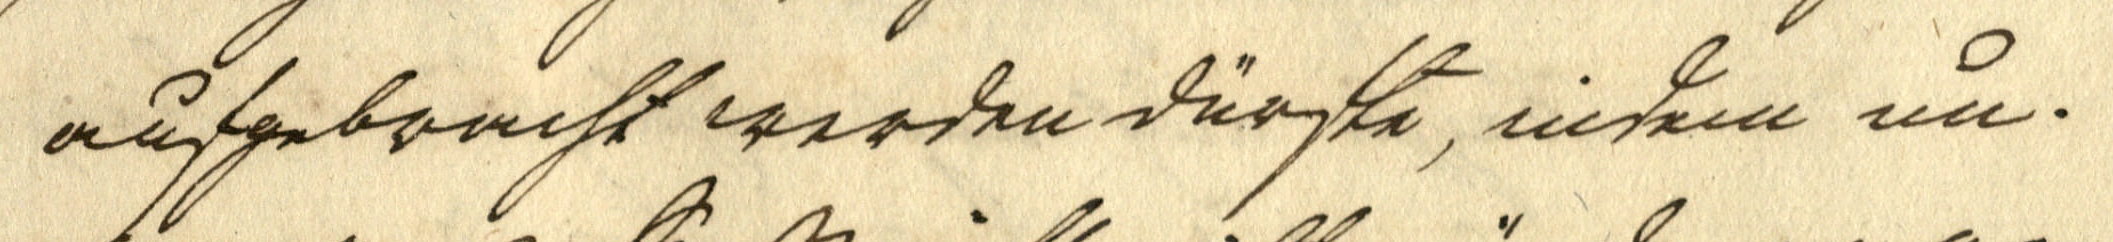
aufgebracht werden dürfte, indem un-
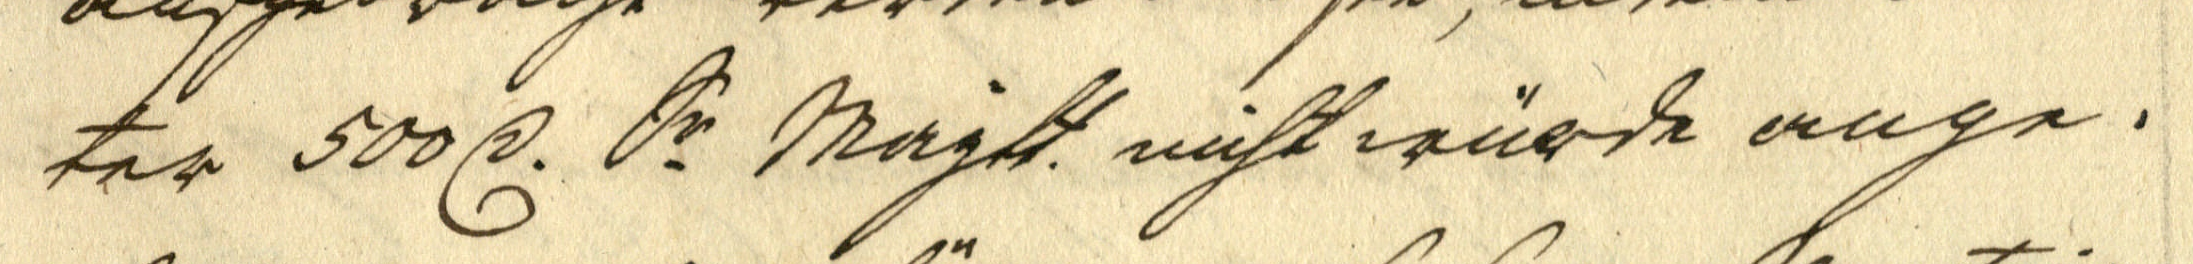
ter 500 rtl. Sr. Maytt. nicht würde ange-
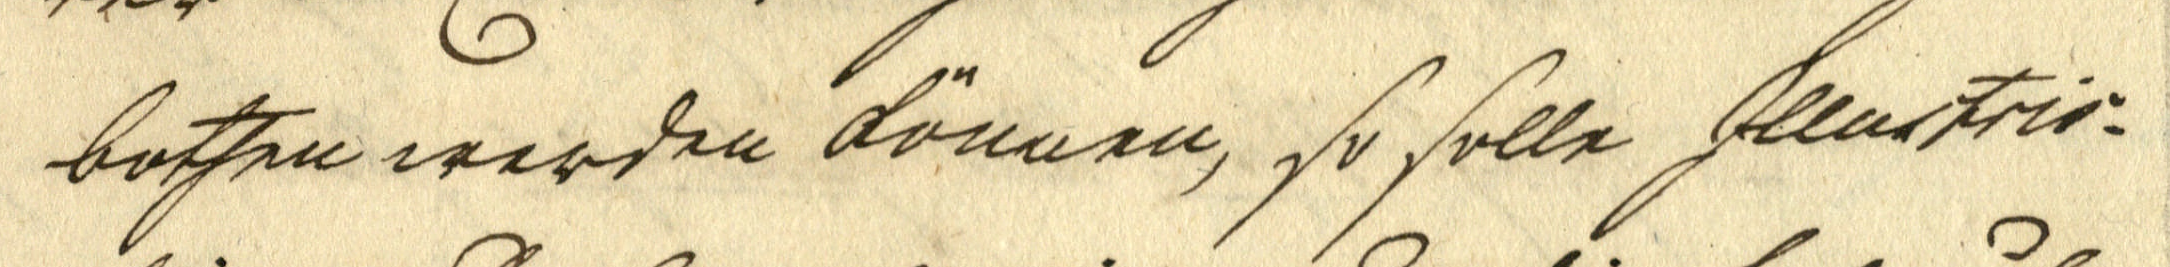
bothen werden können, so solle Illustris-
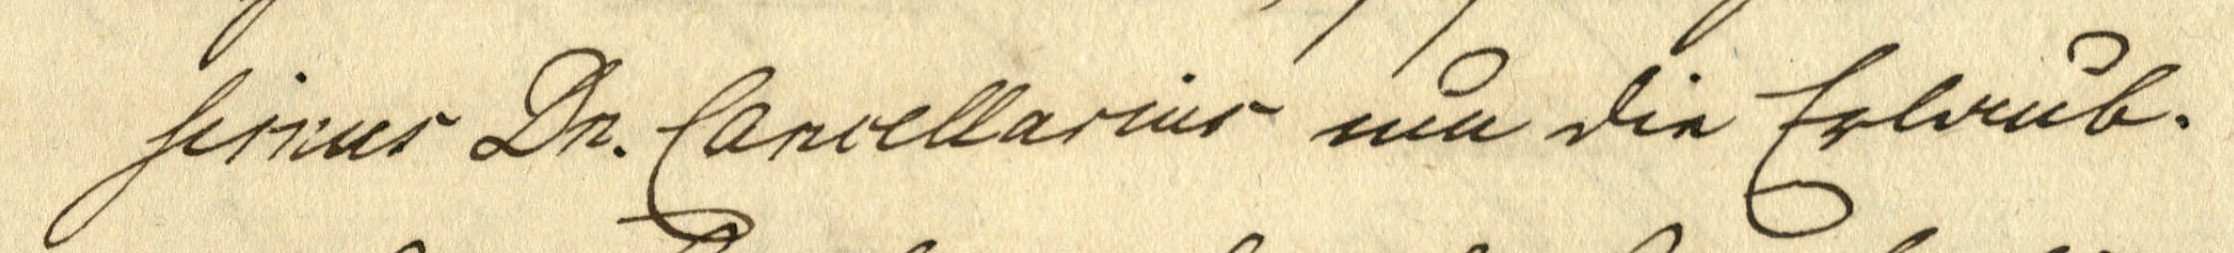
simus Dn. Cancellarius um die Erlaub-
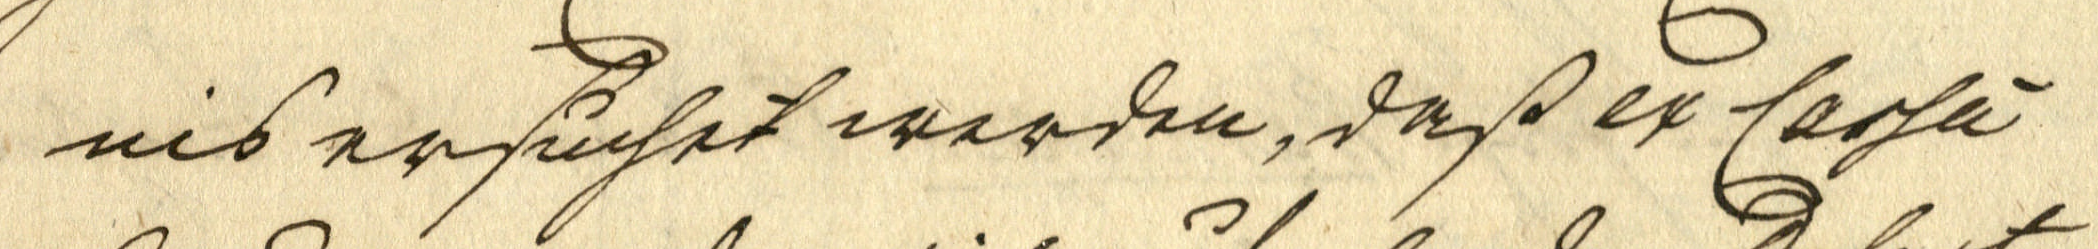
nis ersuchet werden, daß ex Cassa
